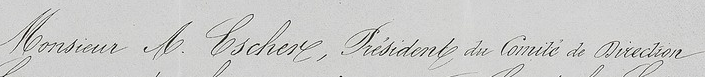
Monsieur A. Escher, Président du Comité de Direction
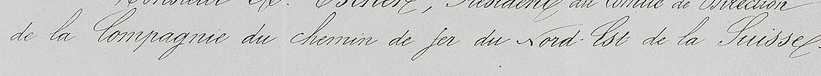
de la Compagnie du chemin de fer du Nord-Est de la Suisse.
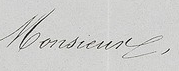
Monsieur,
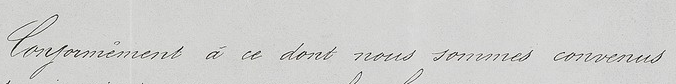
Conformément à ce dont nous sommes convenus
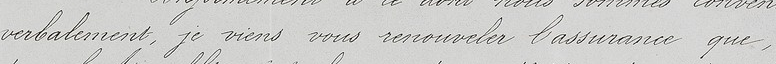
verbalement, je viens vous renouveler l'assurance que,
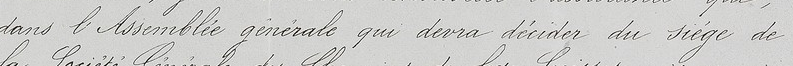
dans l'Assemblée générale qui devra décider du siége de
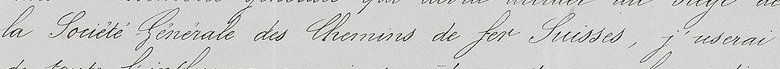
la Société Générale des Chemins de Fer Suisses, j'userai
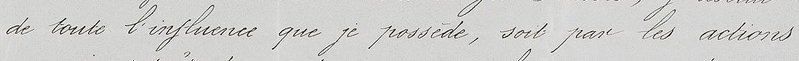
de toute l'influence que je possède, soit par les actions
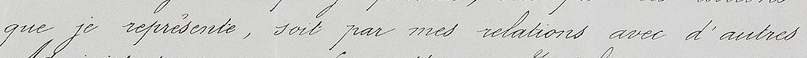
que je représente, soit par mes relations avec d'autres
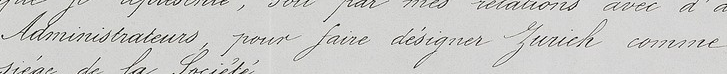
Administrateurs, pour faire désigner Zurich comme
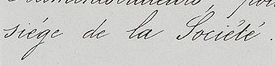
siège de la Société.
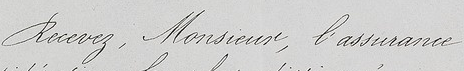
Recevez, Monsieur, l'assurance
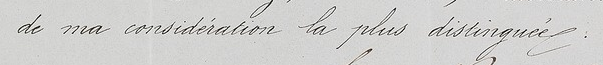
de ma considération la plus distinguée.
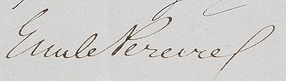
Emile Pereire
